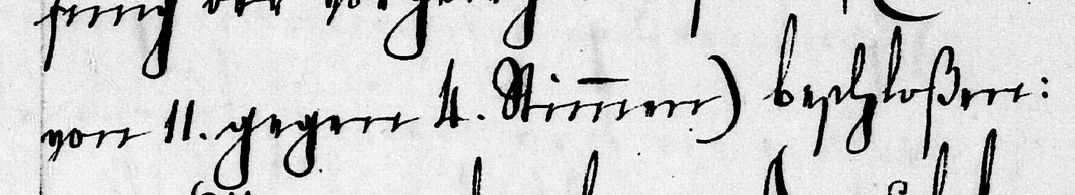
von 11. gegen 4. Stimmen) beschloßen:
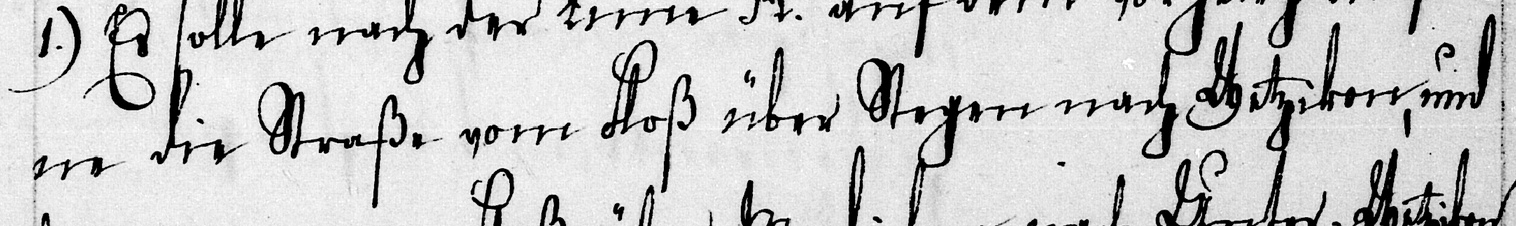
ne die Straße vom Floß über Stegen nach Wetzikon, und
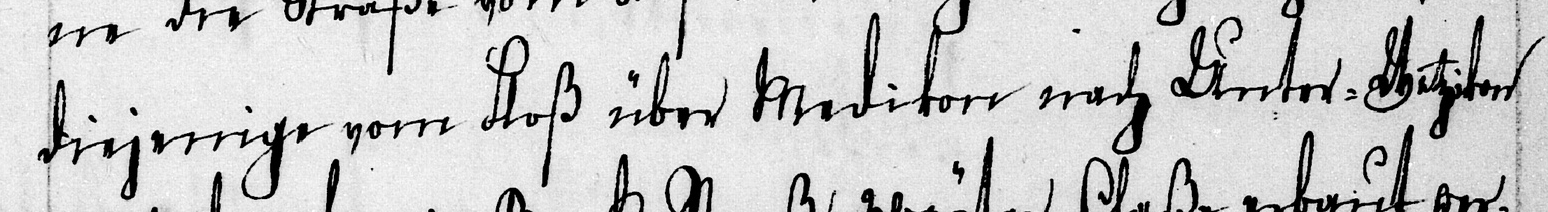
diejenige vom Floß über Medikon nach Unter-Wetzikon
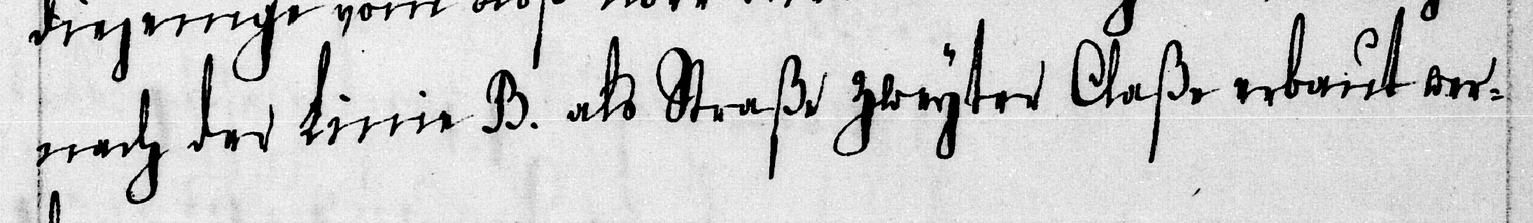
nach der Linie B. als Straße zweyter Claße erbaut wer¬
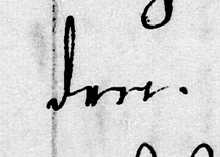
den.
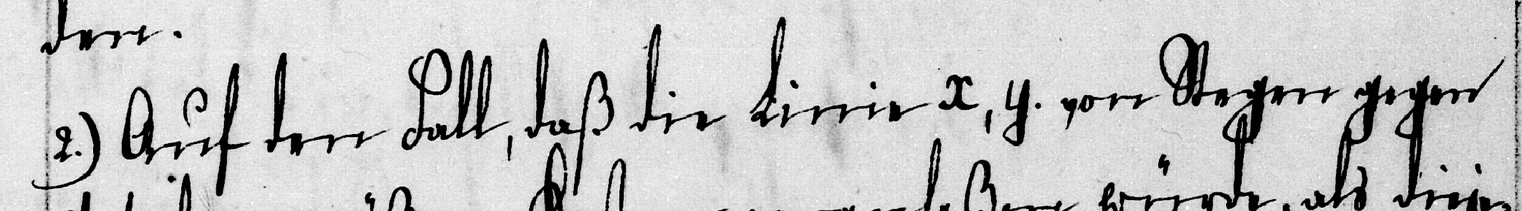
2.) Auf den Fall, daß die Linie x, y. von Stegen gegen
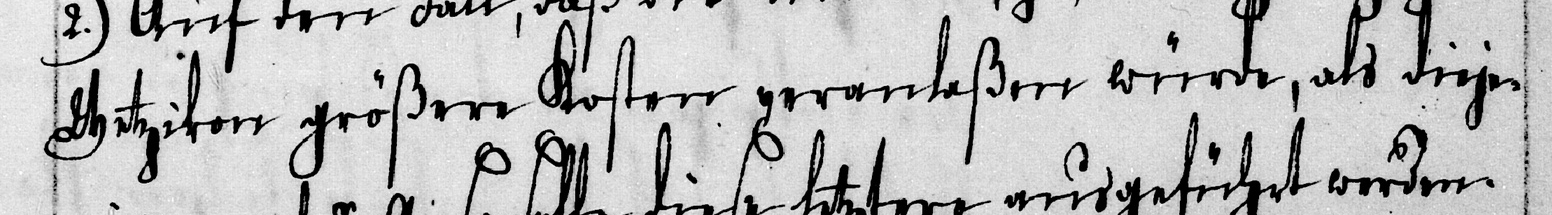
Wetzikon größere Kosten veranlaßen würde, als dieje¬
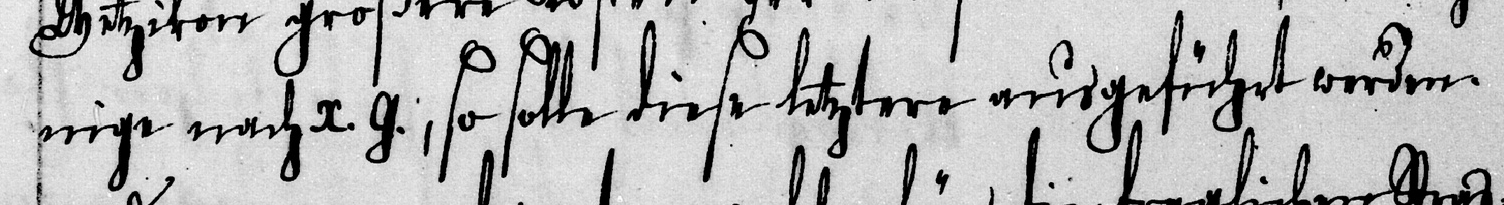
nige nach x.g., so solle diese letztere ausgeführt werden.
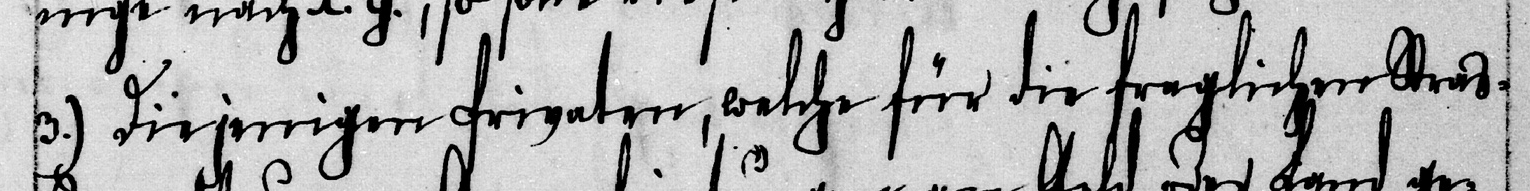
3.) Diejenigen Privaten, welche für die fraglichen Straß¬
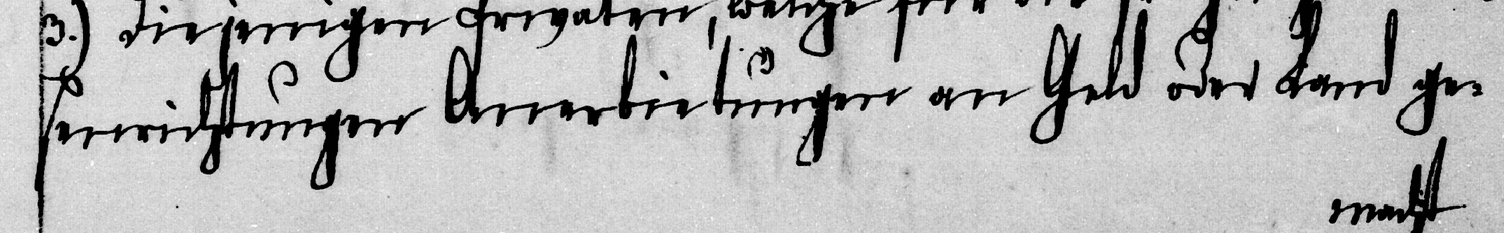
enrichtungen Anerbietungen an Geld oder Land ge-
